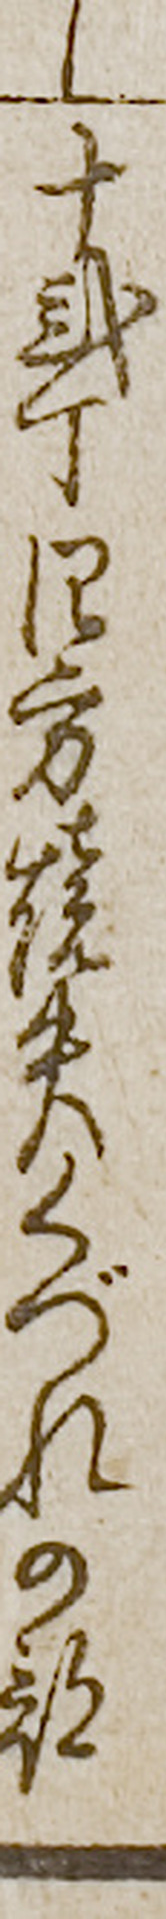十弐丁四方焼失くづれの部
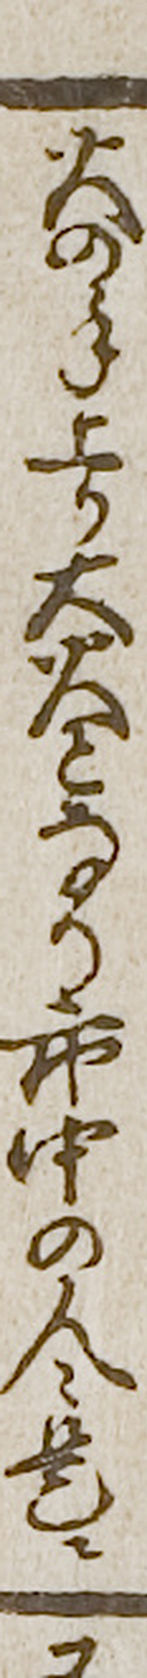火の手上り大火となり市中の人々是に
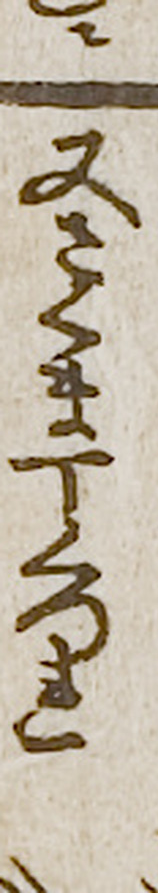又さくま丁くつれ
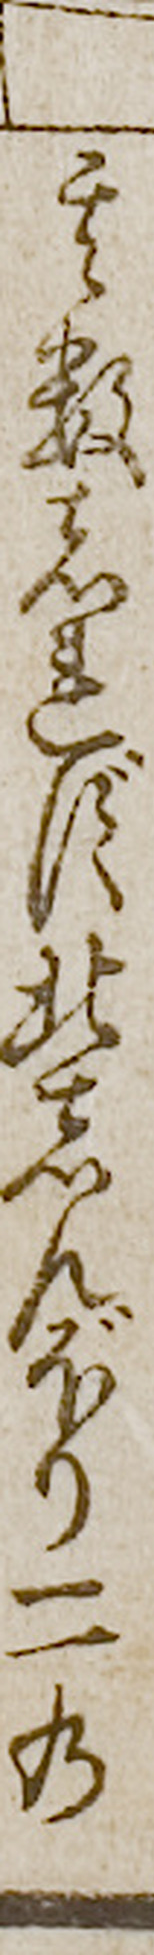其数しれず北しんぼり二の
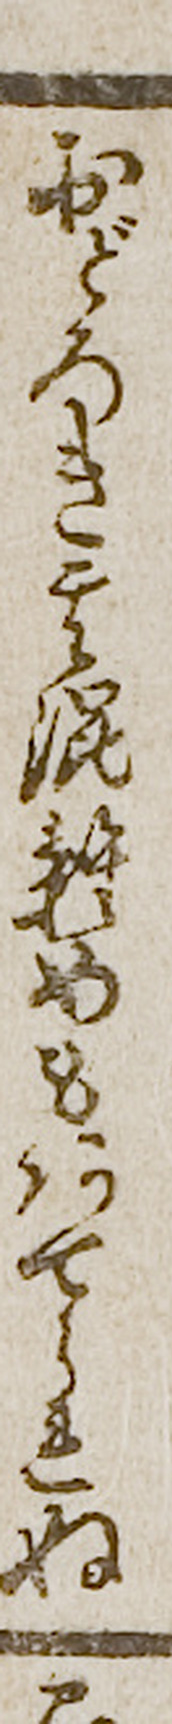おどろき其混雑めもあてられぬ
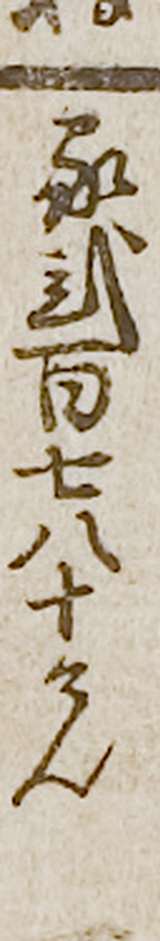家弐百七八十けん
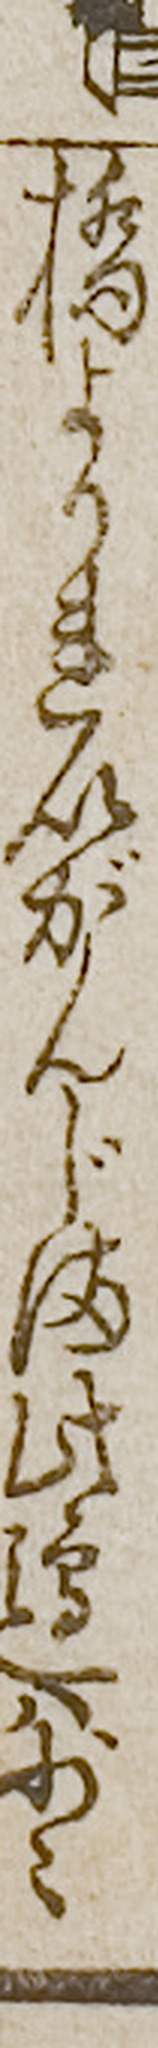橋よりれいがんじま此辺は少々
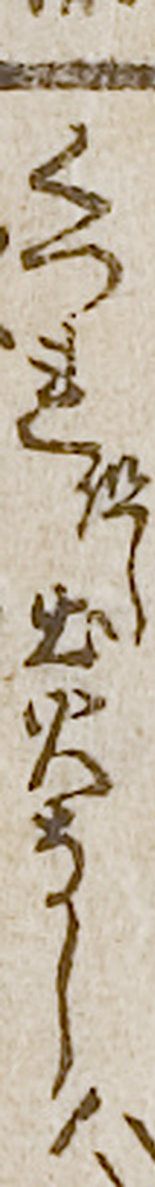くつれ但し出火なし
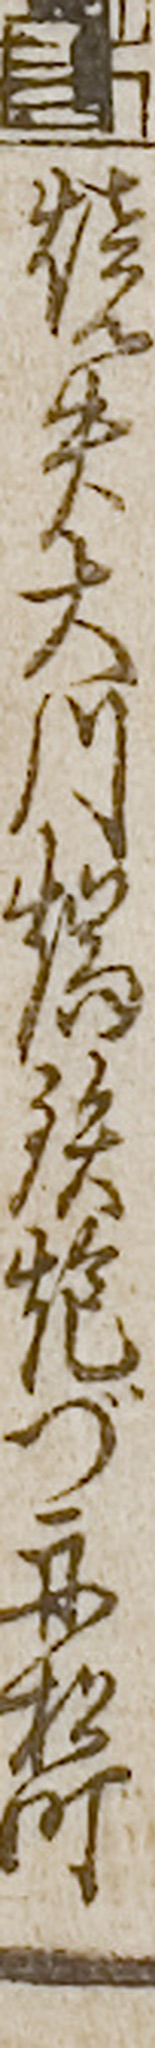焼失大川端鉄砲づ舟松町
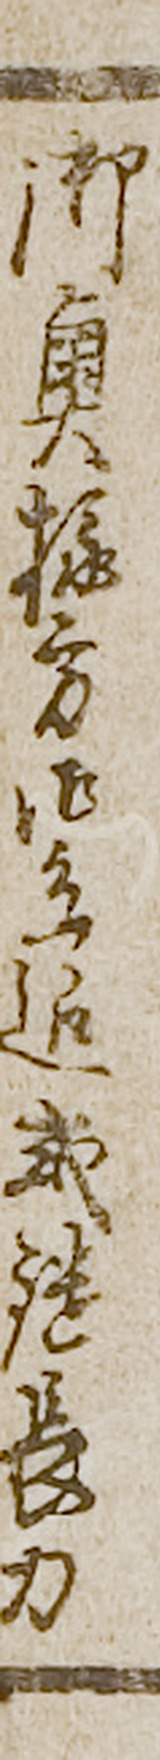御奥様方御立退或鑓長刀
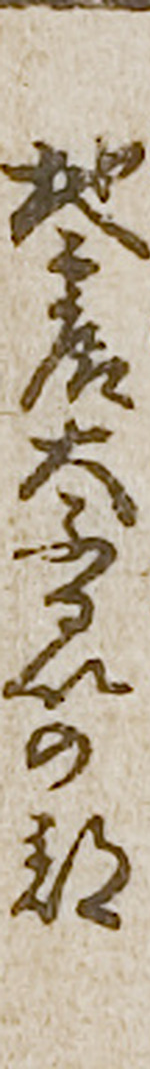地震大ふるいの部
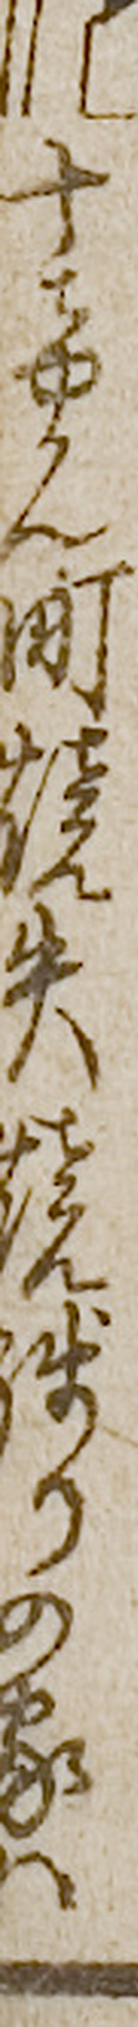十けん町焼失焼残りの家は
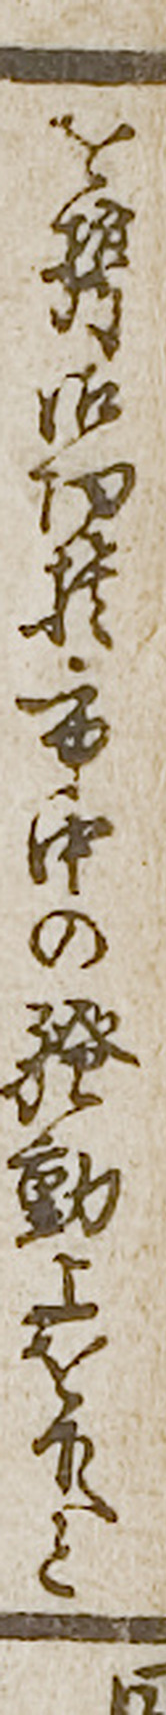を携切捨市中の騒動上を下と
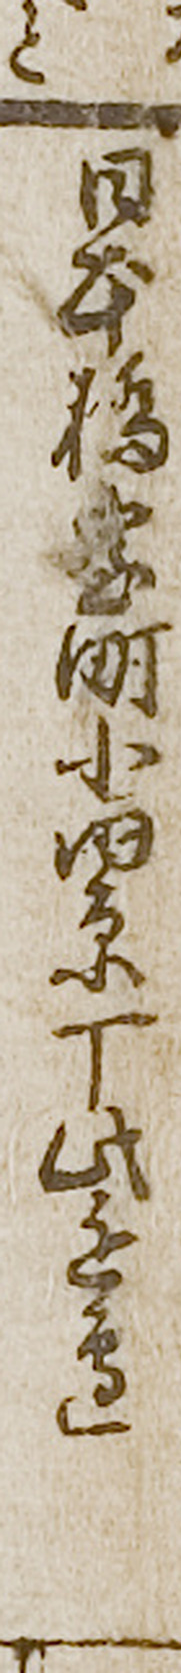日本橋宝町小田原丁此近辺
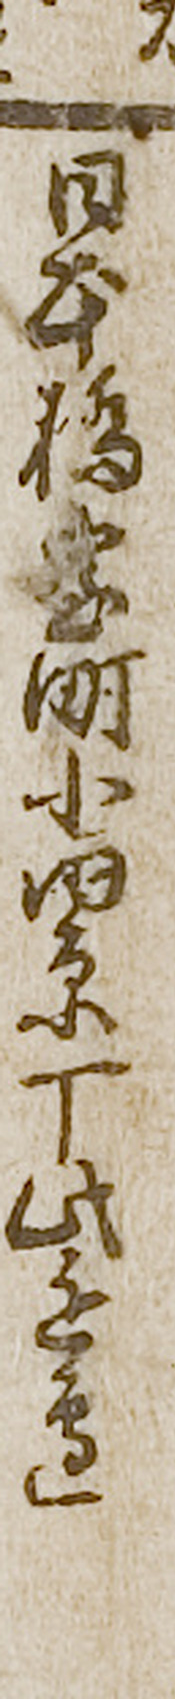日本橋宝町小田原丁此近辺
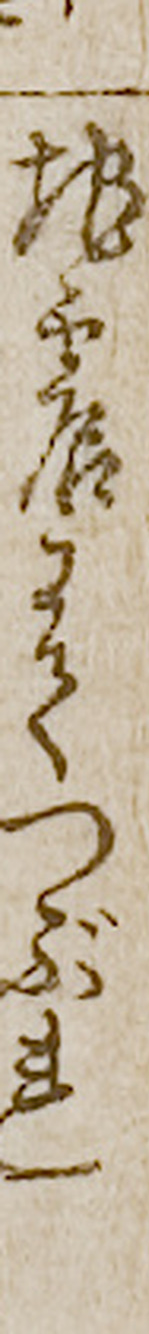地震にてつぶれ
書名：東都珍事実録咄
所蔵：東京大学総合図書館 General Library in the University of Tokyo, JAPAN
